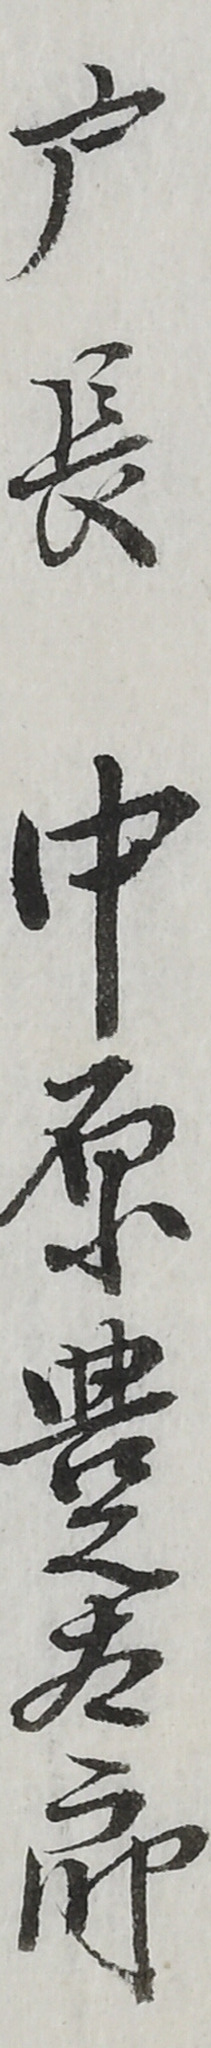戸長中原豊太郎
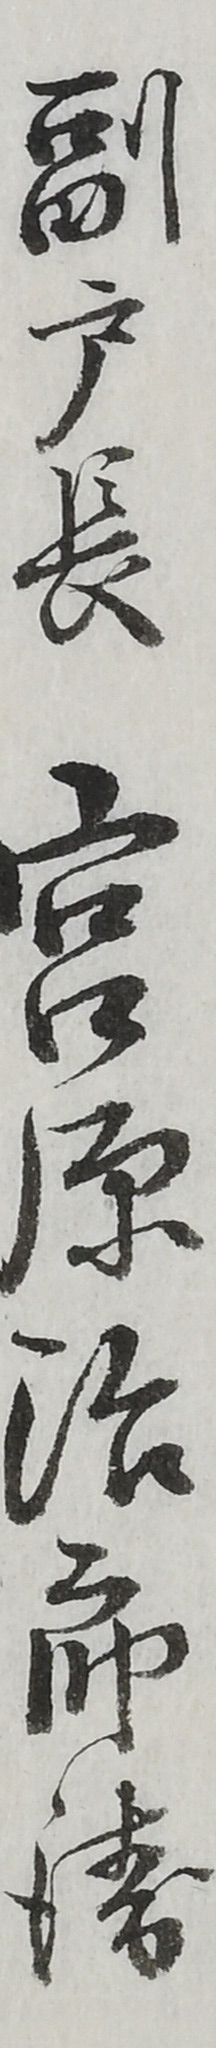副戸長宮原治郎衛
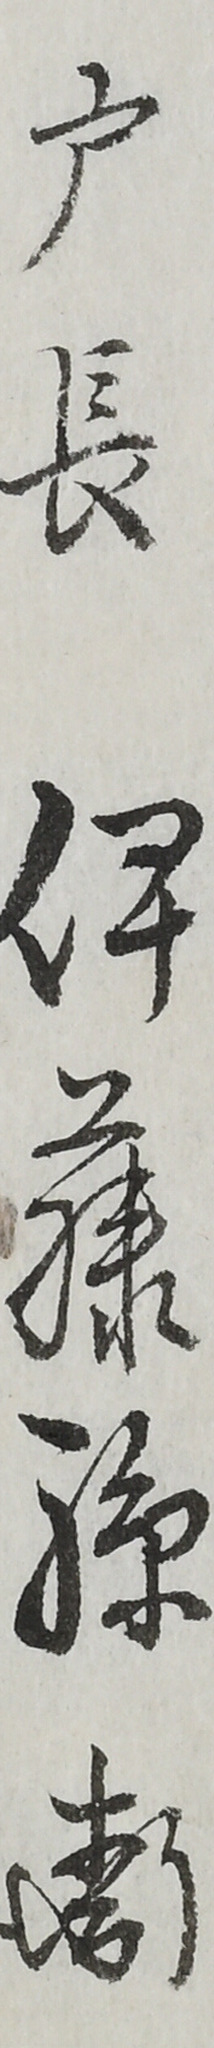戸長伊藤孫衛
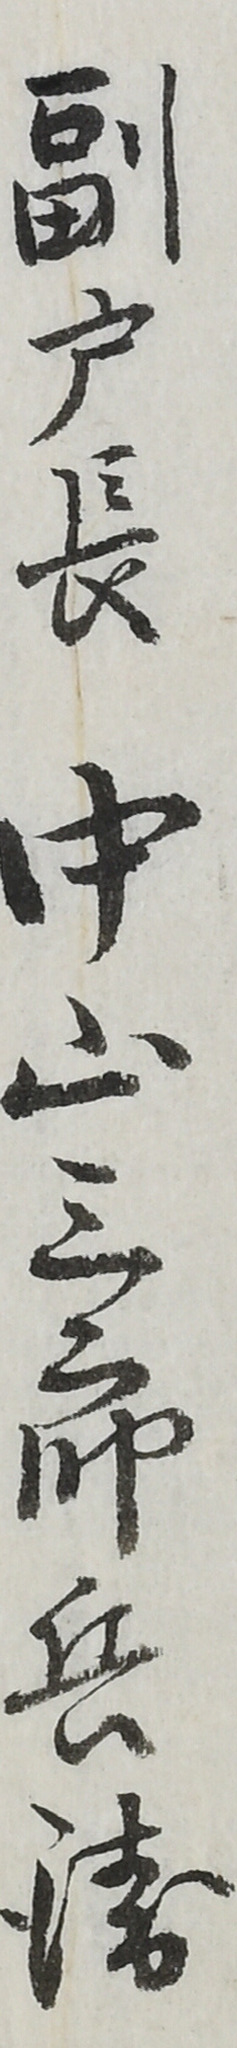副戸長中山三郎兵衛
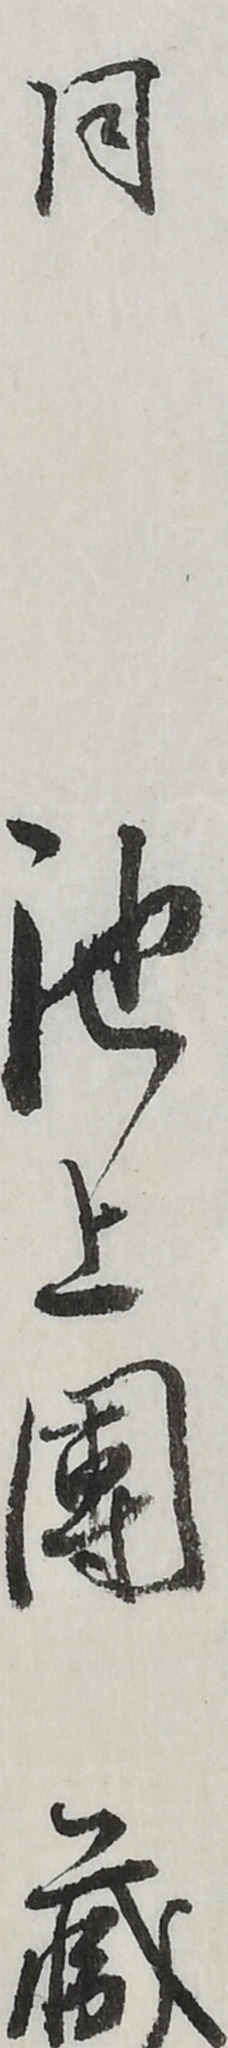同池上団蔵

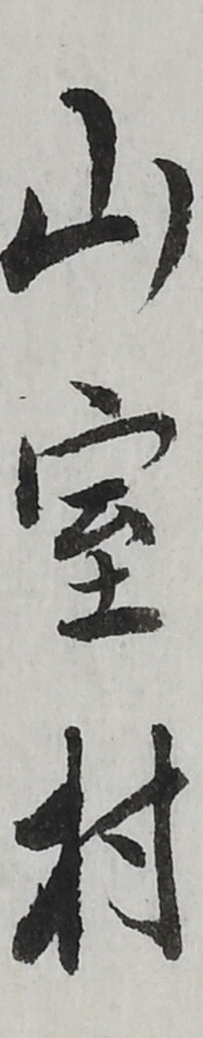山室村
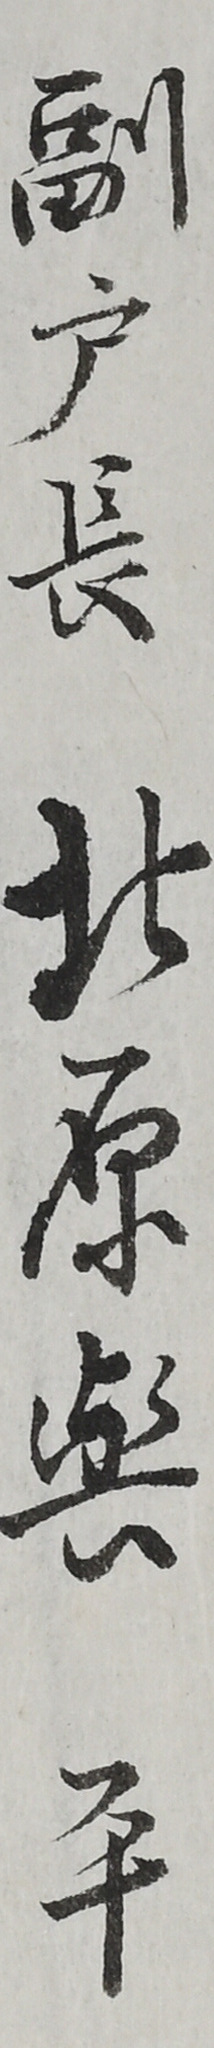副戸長北原与平
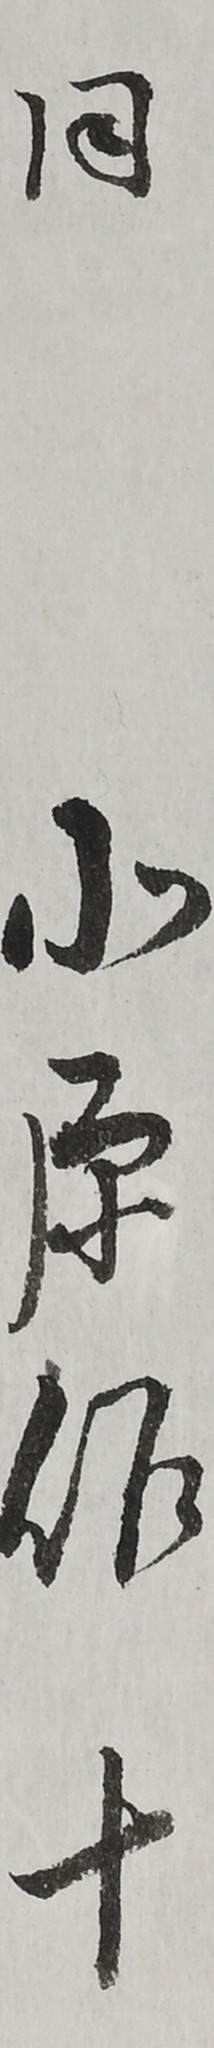同北原作十
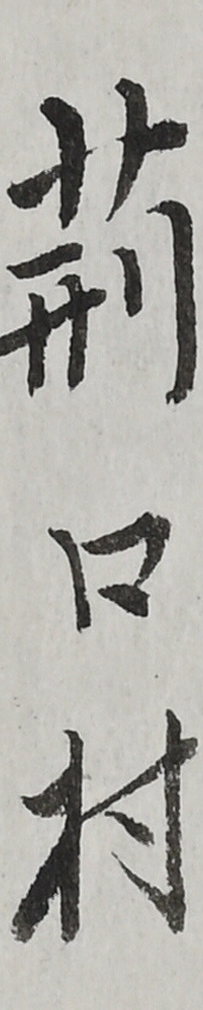荊口村
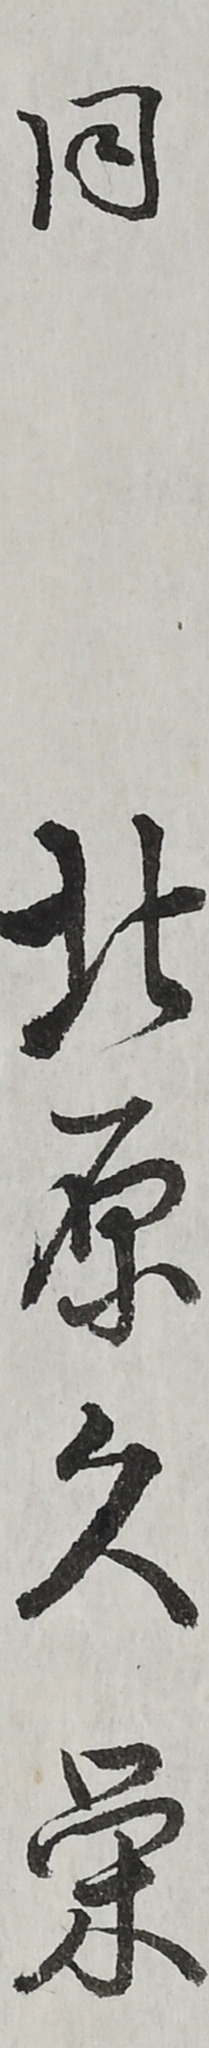同北原久栄
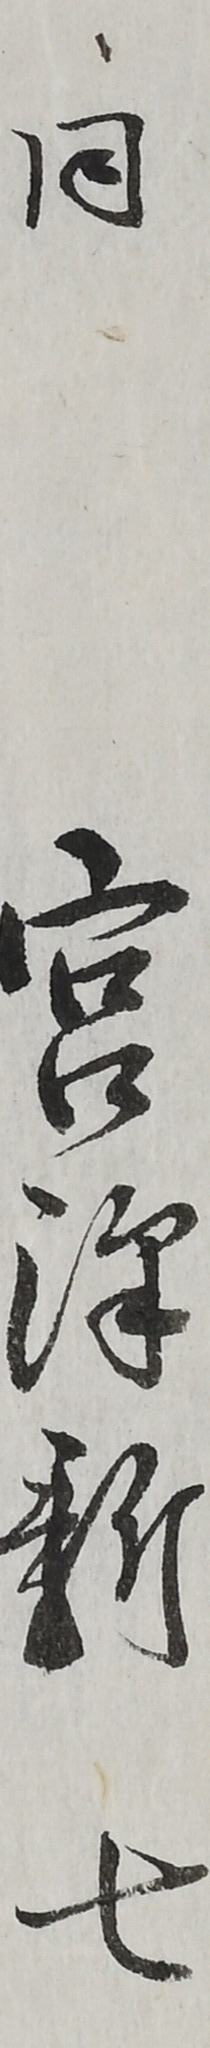同宮澤新七
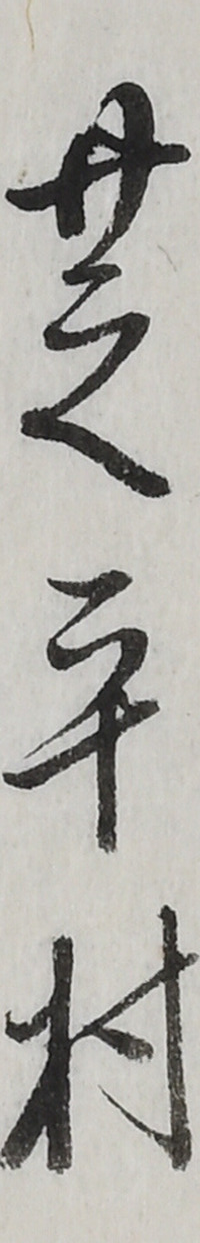芝平村
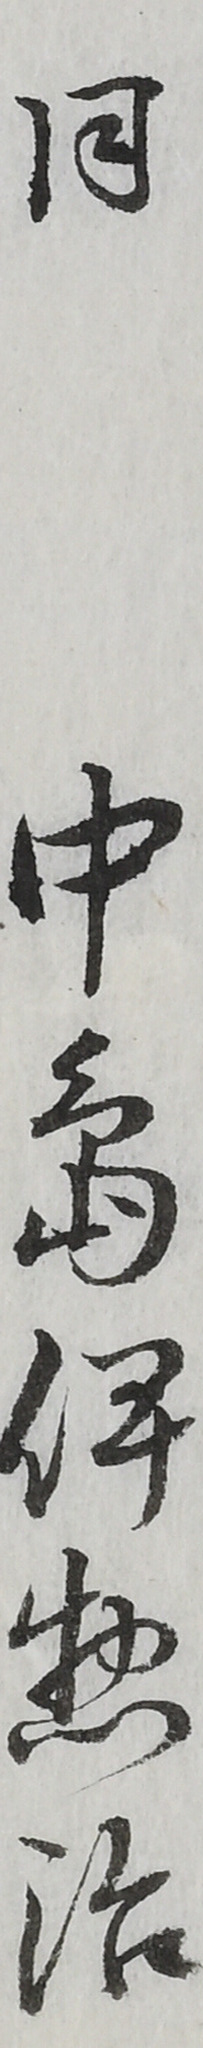同中島伊惣治
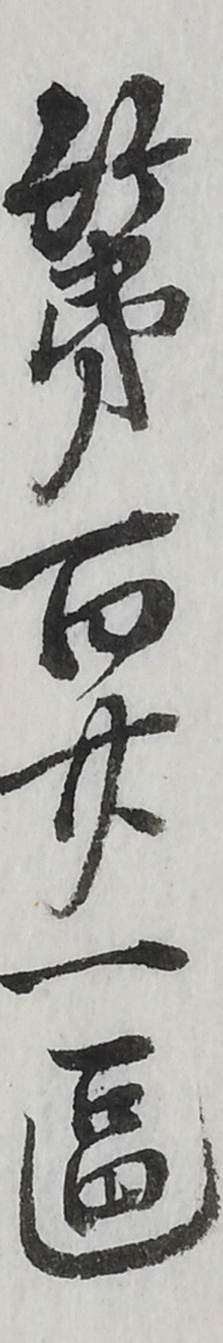第百廿一区
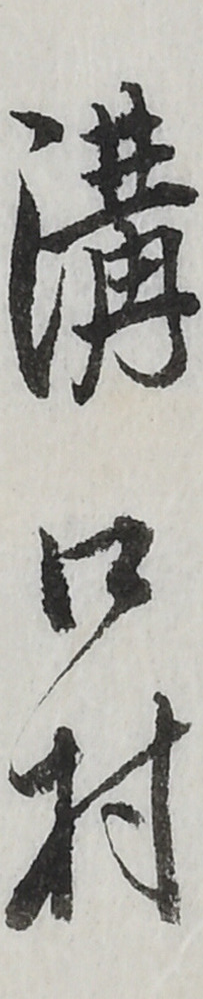溝口村
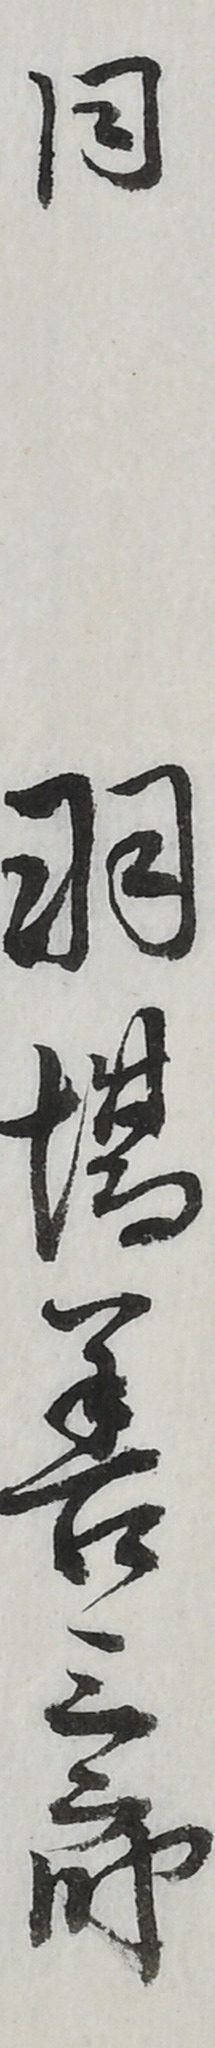同羽場善三郎
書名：伊那郡毎村戸長副戸長名簿
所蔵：伊那市立高遠町図書館・合同会社AMANE
